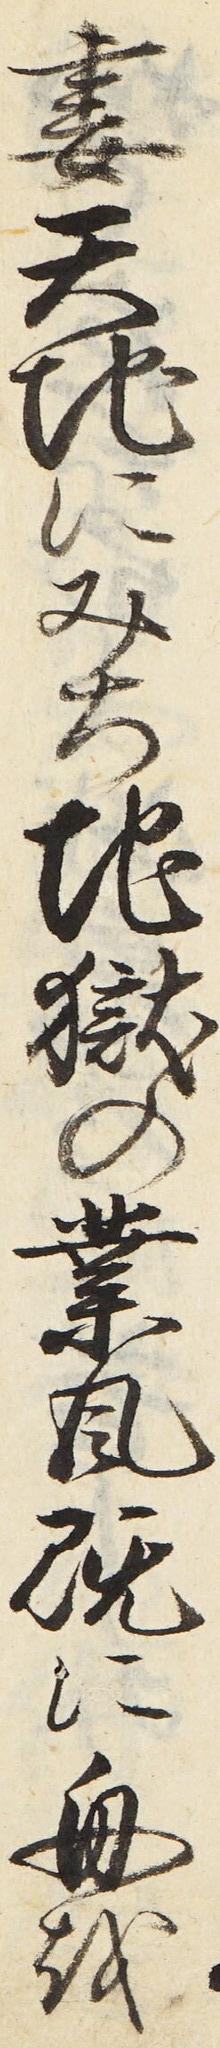妻天地にみち地獄の業風既に舟を
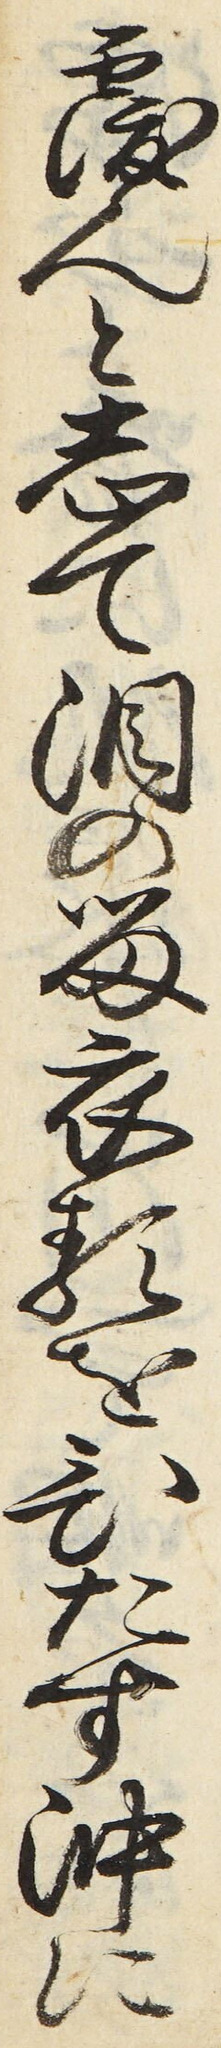覆んとして泪の留衣類をひたす沖に

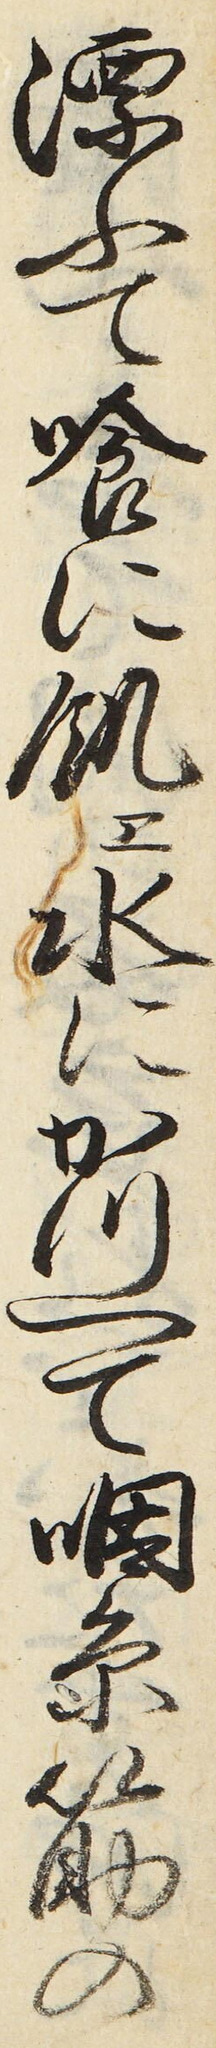漂ふて喰に飢え水にかつへて咽糸筋の
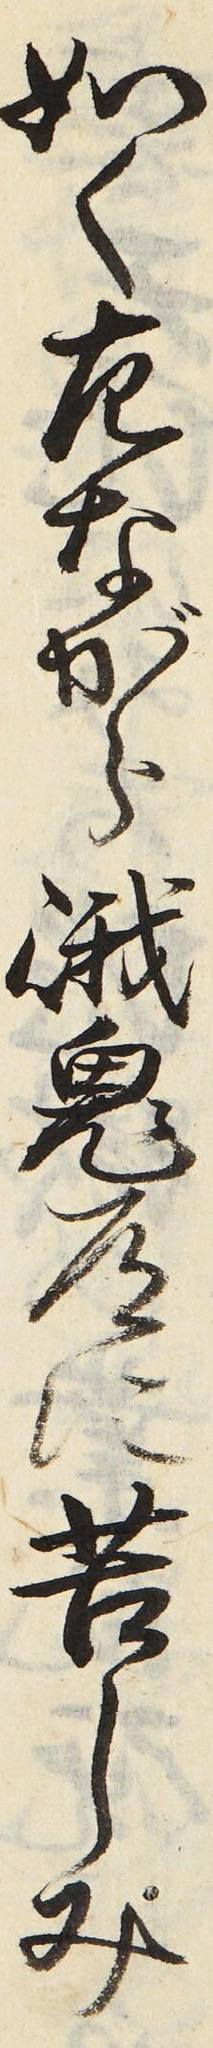如くさながら餓鬼道に苦しみ
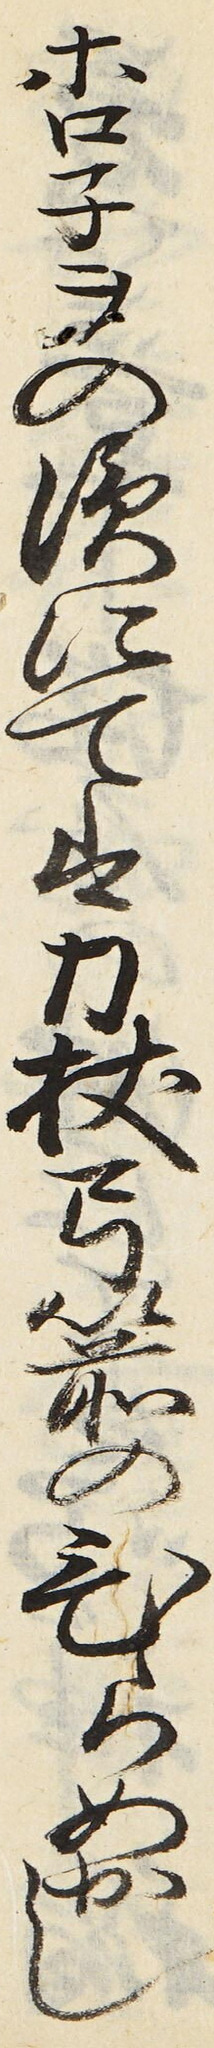ホロネヲの浜にては刀杖弓箭のひらめかし
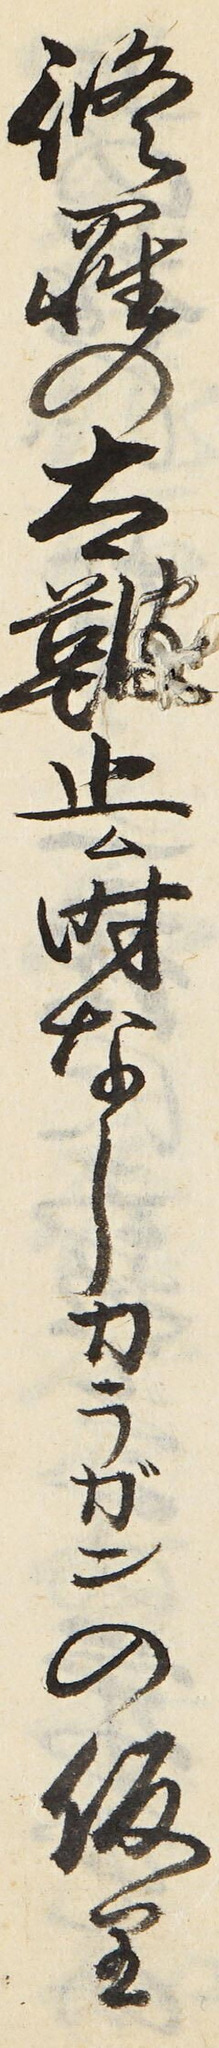修羅の太鼓止む時なしカラガンの仮り
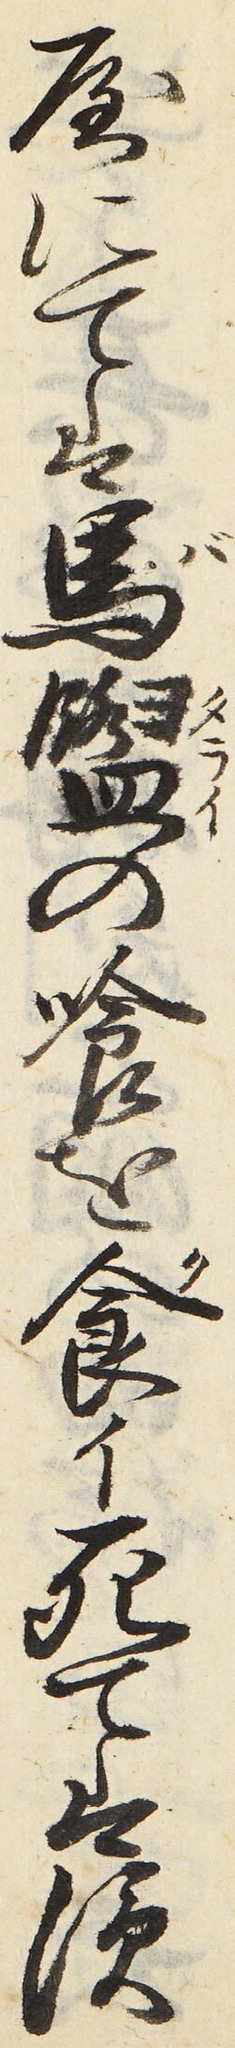屋にては馬盥の喰を食い死ては浜
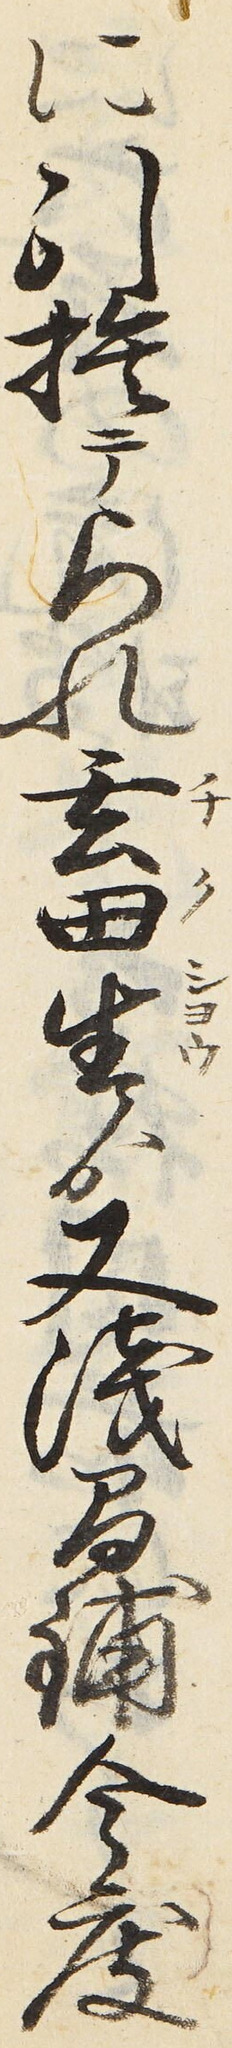に引捨てられ畜生ゟ又浅間鋪今度
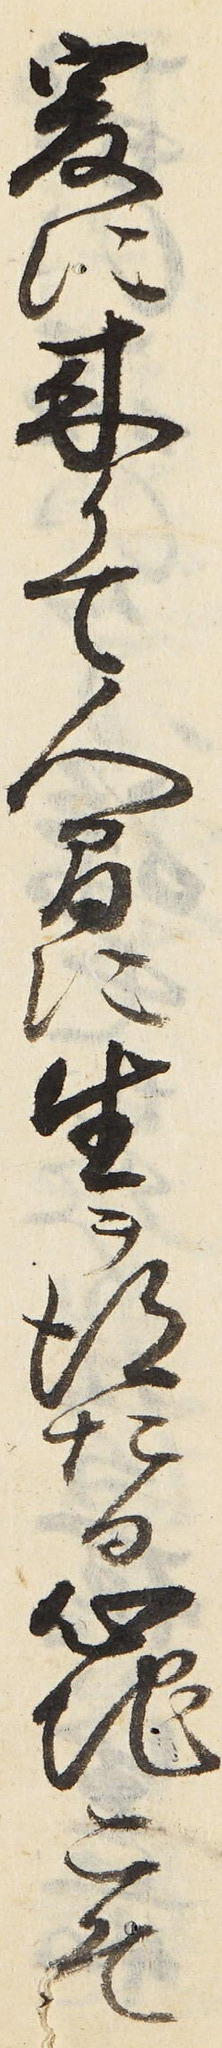爰に来りて人間に生を得たる心地こそ
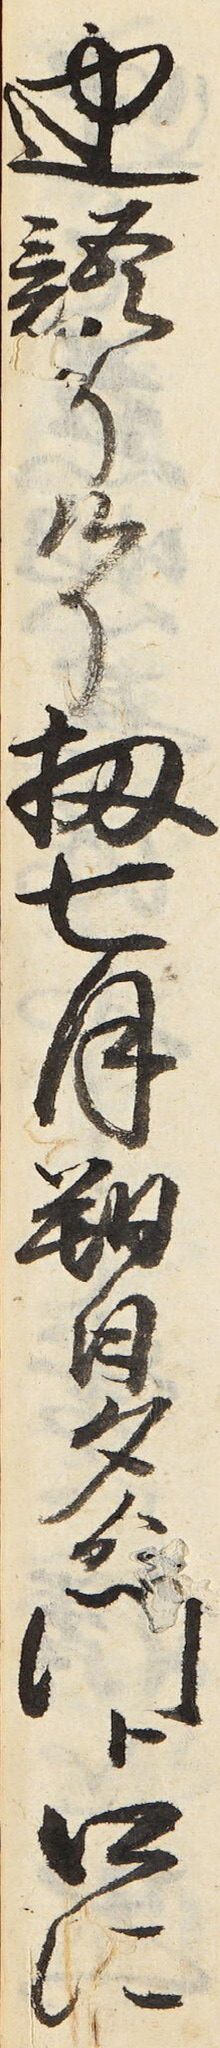迚語りけり扨七月朔日夕ゟ門と口に
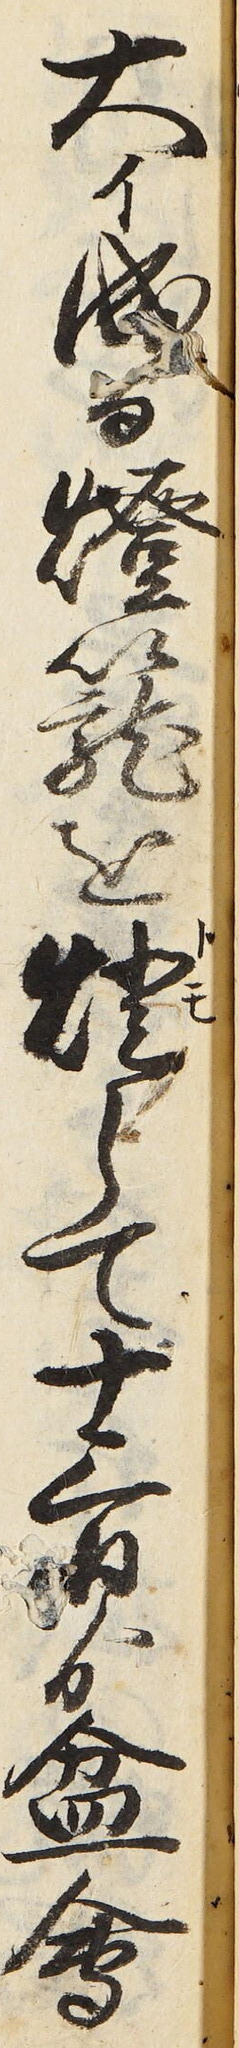大い成る燈籠を燈して十三日ゟ盆会
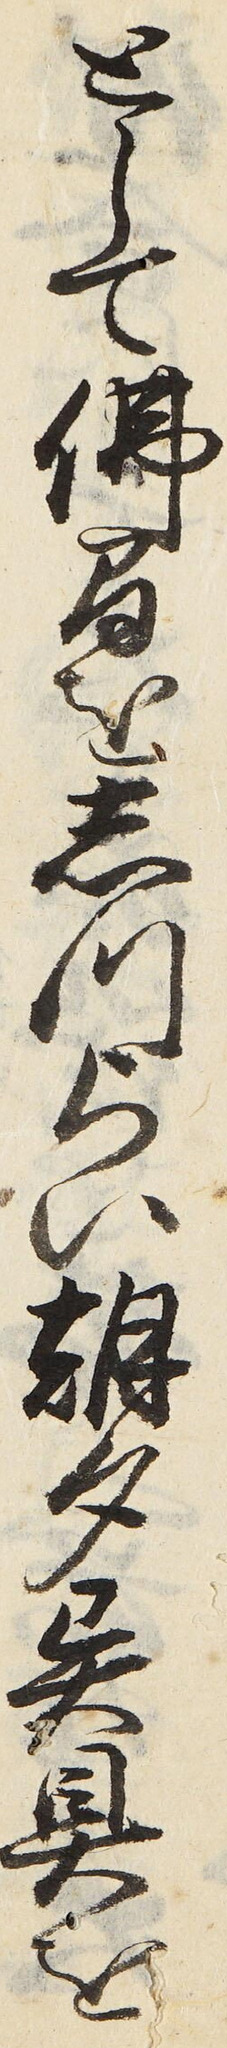として仏間をしつらい朝夕異具を
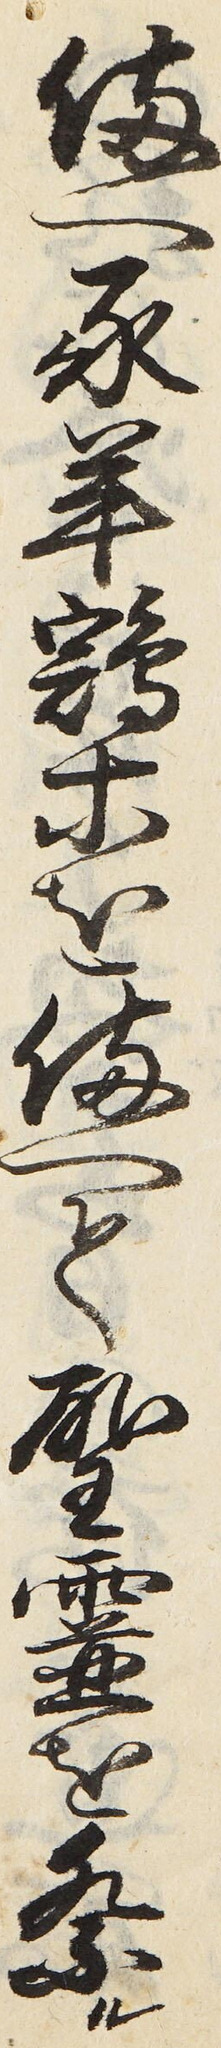備へ豕羊鶴等を備へて聖霊を祭る
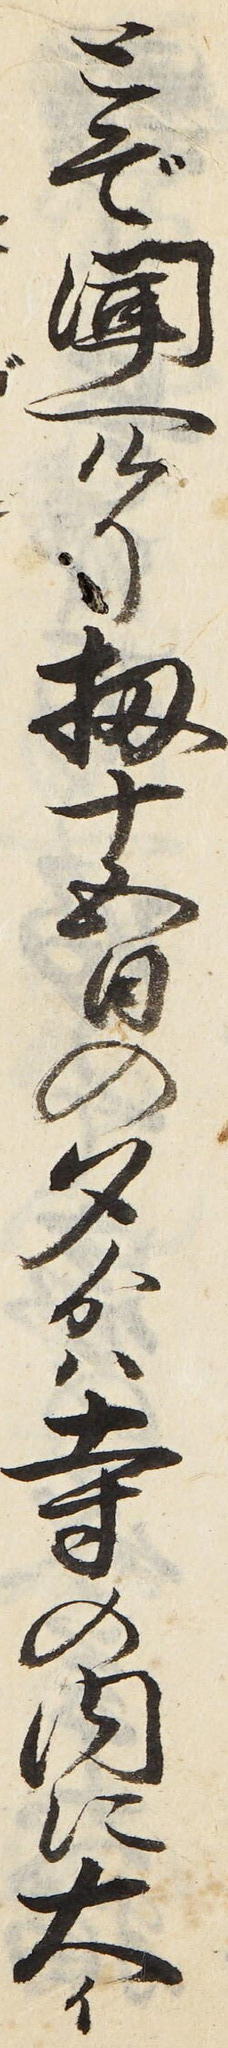とぞ聞へけり扨十五日の夕ゟは寺の内に大い
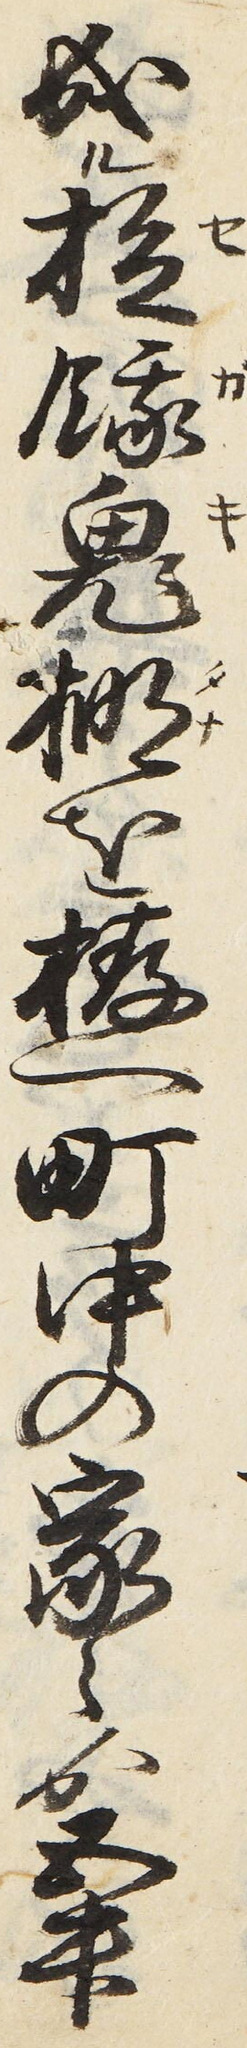成る施餓鬼棚を拵へ町中の家々ゟ五升
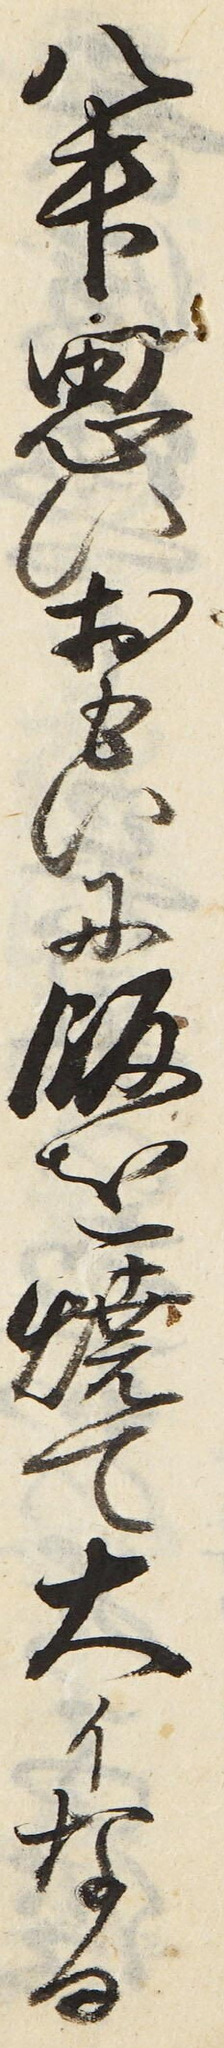八升思ひおもいに飯を焼て大いなる
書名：華夷九年録
